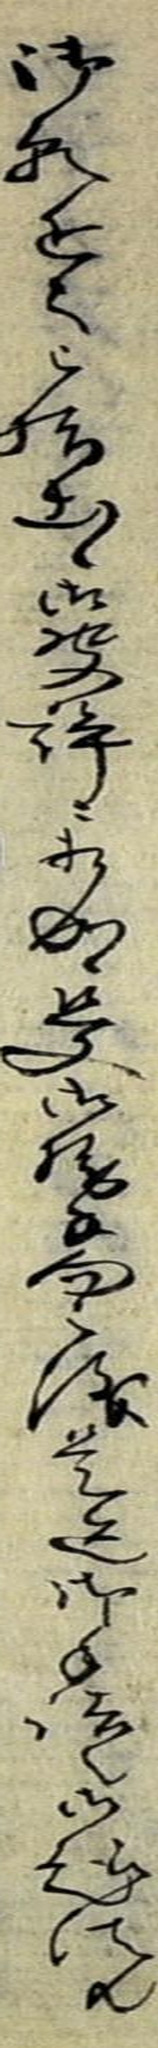御願近く被指出候御決評ニ相成候且又御勝手向之儀是迄御手法之御趣法共
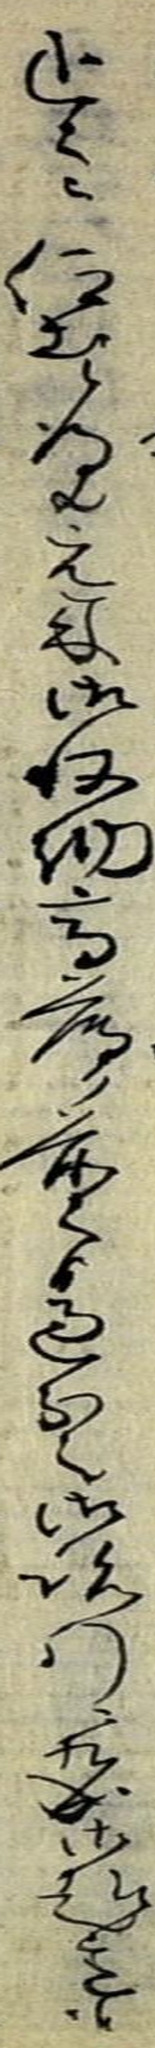追々ニ仰出候得共元来御収納高薄ク前々ゟ過分之御跡引ニ相成御趣意も
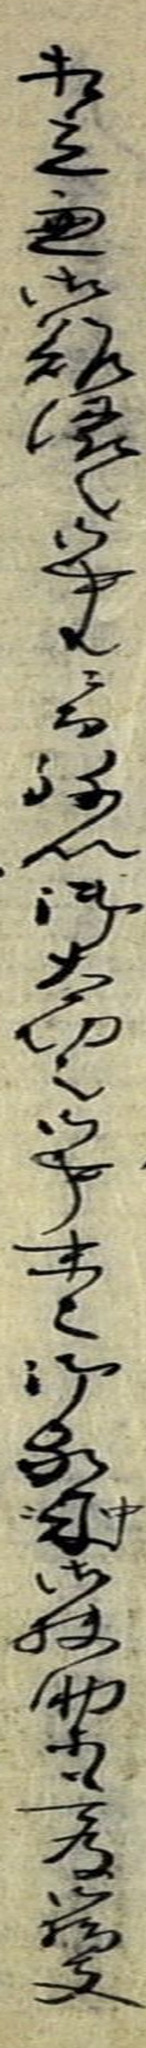相立兼御難渋之御事共ニ而弥以御太切之御事末之御家来中御扶助等も可及御指支
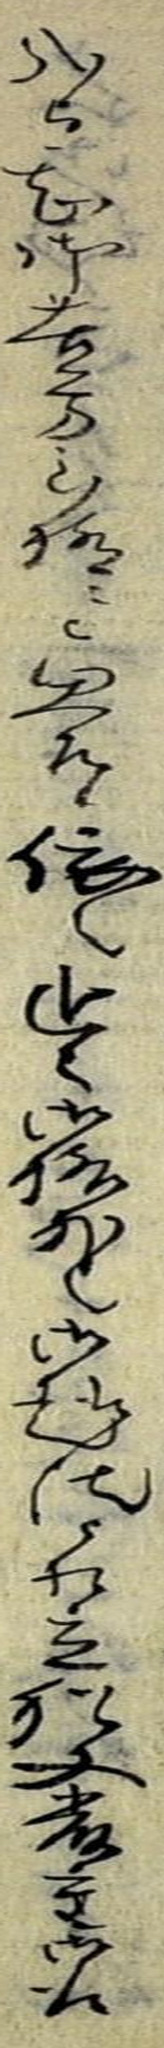哉与甚御苦労至極ニ被思召候依之追々御格外之御趣法被相立猶又厳重御取
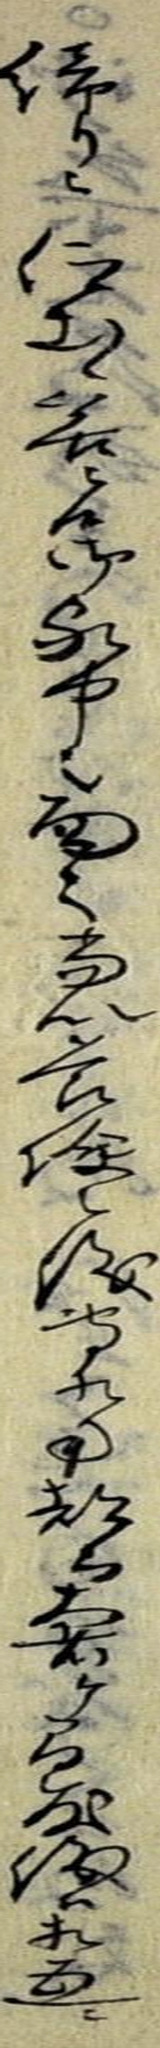締り被仰出候筈ニ候御家中之面々尚以節倹之儀専相用都而奢ケ間敷儀ハ相互ニ
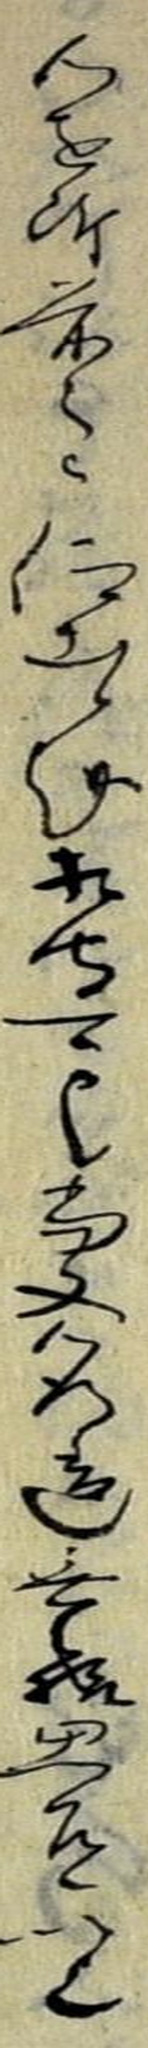心を付前々被仰出候趣相守可申候尚又心得違無之様思召候以上
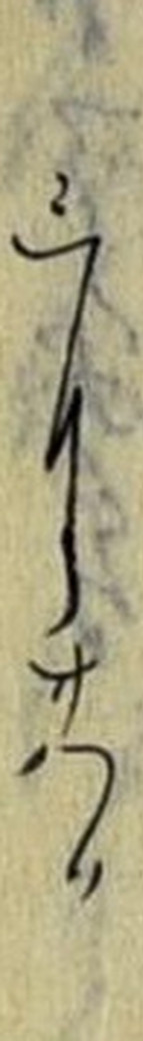三月廿八日
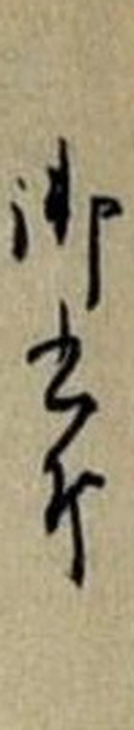御書付
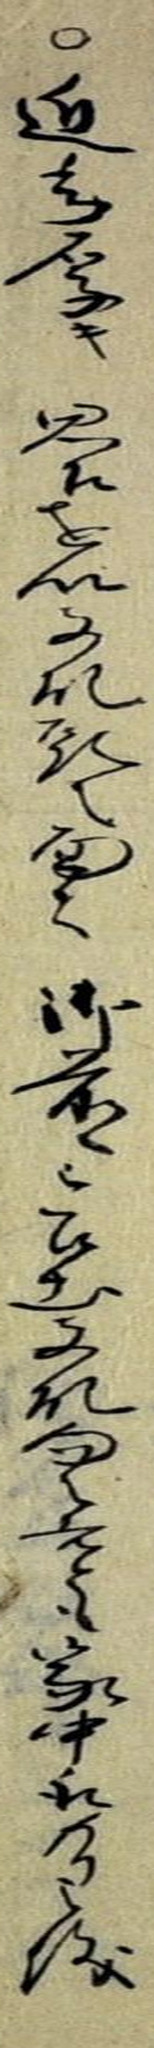〇近年厚キ思召を以支配頭之面々御前へ被召出支配向之者とも家中取〆り之儀
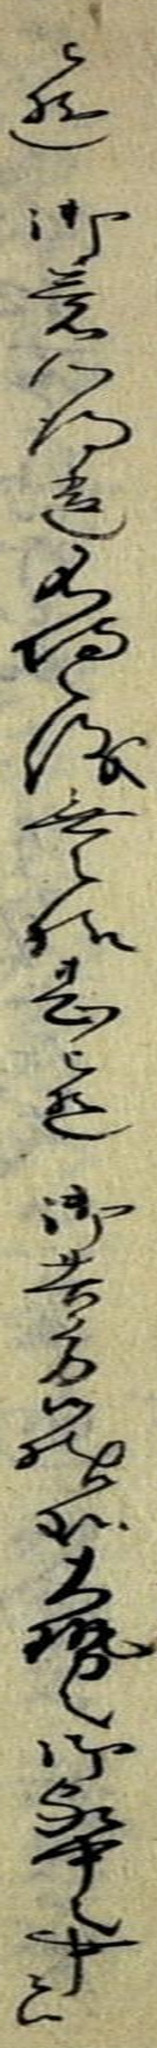被遊御意心得違不埒之儀無之様甚被遊御苦労候然ル処大勢之御家中之事ニハ
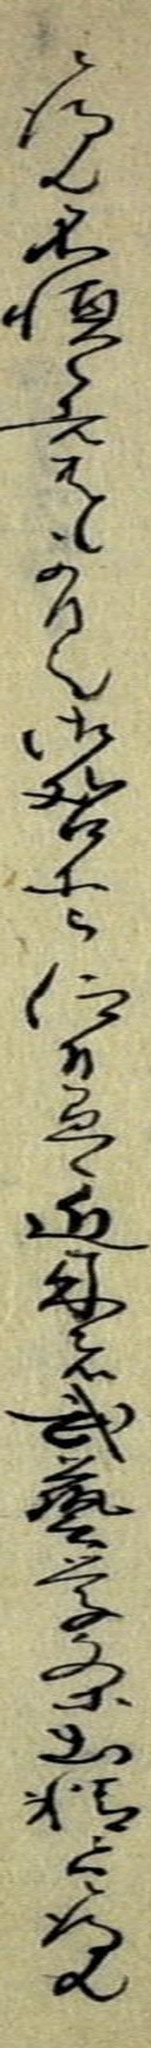候得共不慎之者共も可有之御咎等被仰付置候近来者武芸学文等出精ニハ候得共
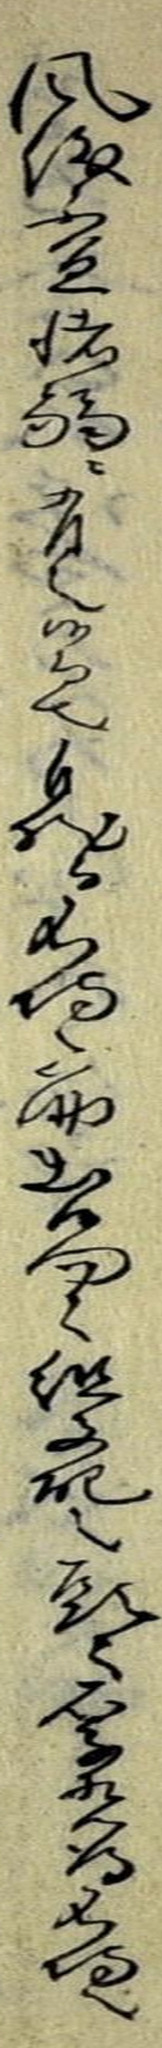風儀不宜惰弱ニ有之候而者自然与不埒之筋出候向々組支配之頭々厚相心得不埒之
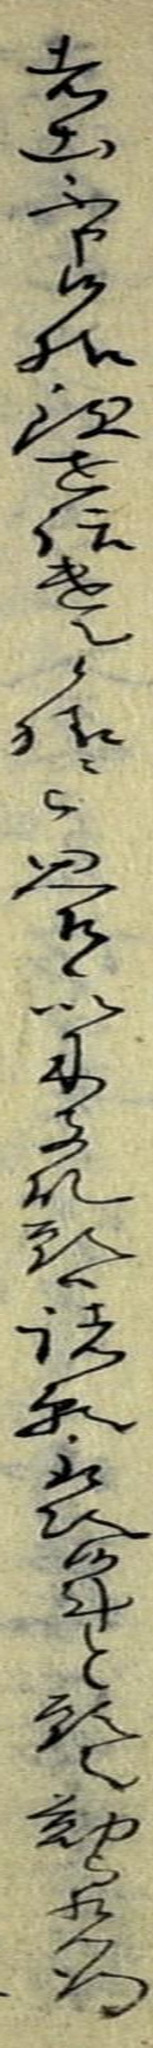者出不申候様致世話遣し候様ニ被思召候以来支配頭ハ諸願取次候斗と頭之勤与相心得
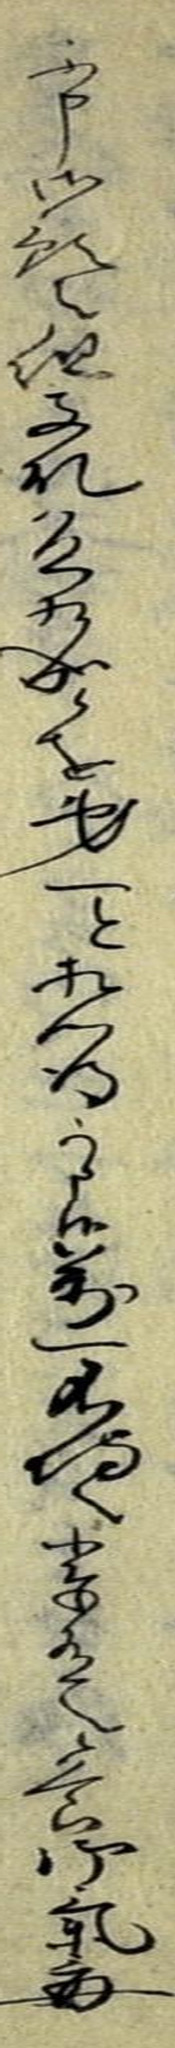不申御預之組支配宜相成候を第一と相心得可申候万一不埒之輩有之候節御気毒
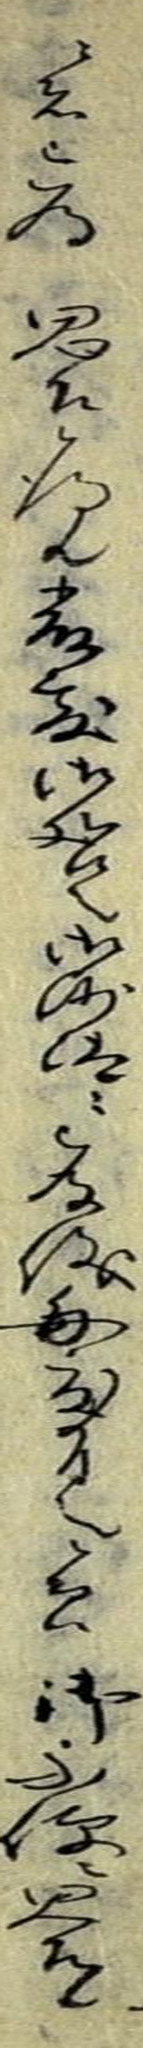ニ者被為思召候得共厳敷御咎之御沙汰ニ被及儀毎度有之候而ハ御不便ニ思召候
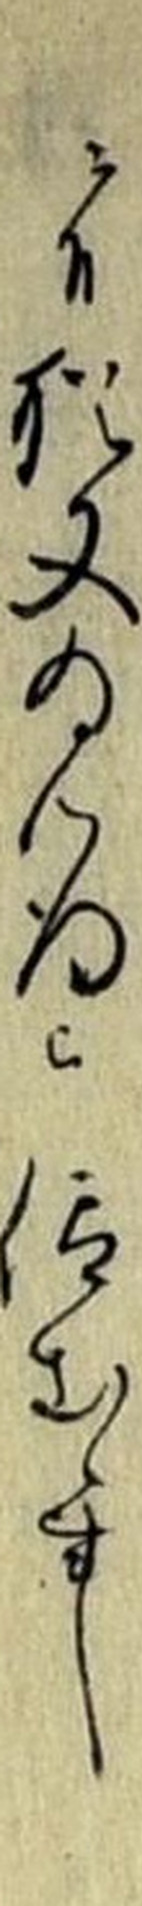ニ付猶又為心得被仰出候事
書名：命令之部 三
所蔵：福井県文書館 Fukui Prefectural Archives
